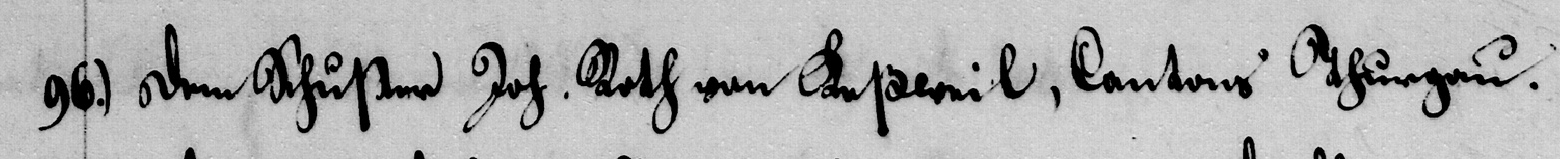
96.) Dem Schuster Joh. Roth von Keßweil, Cantons Thurgau.
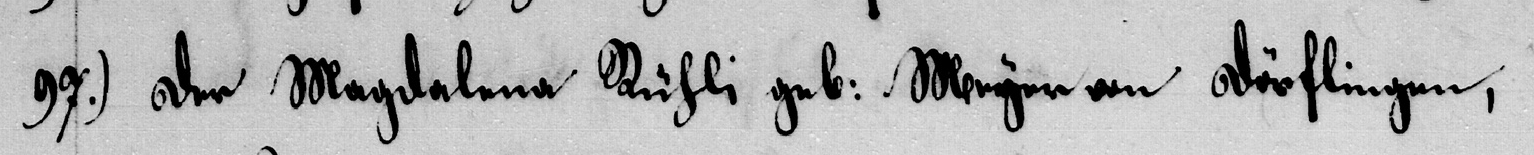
97.) Der Magdalena Rühli geb. Meyer von Dörflingen,
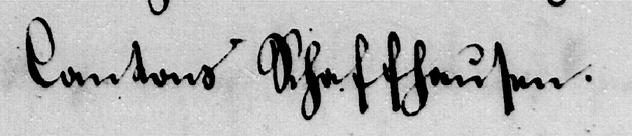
Cantons Schaffhausen.
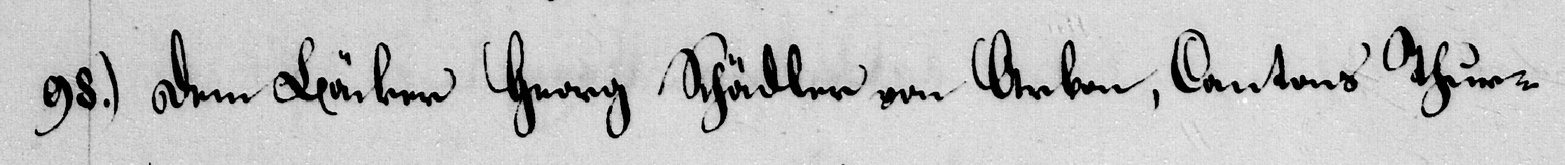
98.) Dem Bäcker Georg Schädler von Arbon, Cantons Thur¬
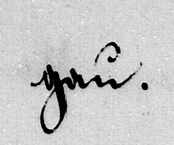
gau.
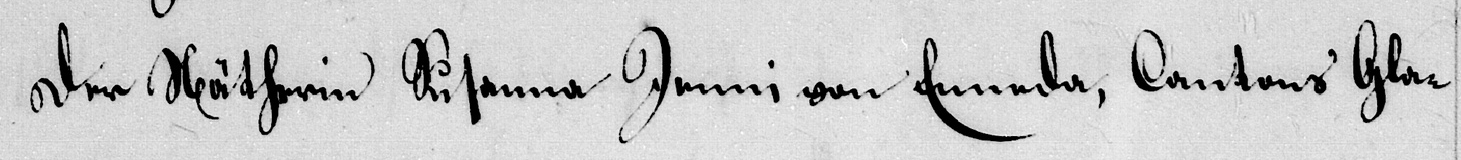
Der Nätherin Susanna Jenni von Enneda, Cantons Gla¬
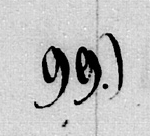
99.)
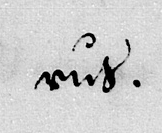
rus.
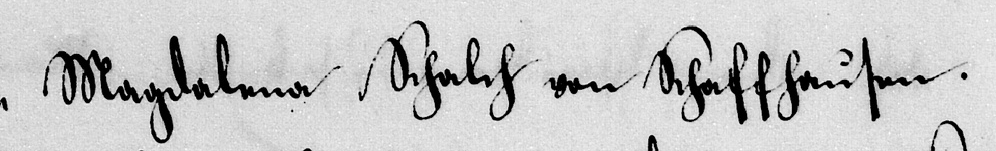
Magdalena Schalch von Schaffhausen.
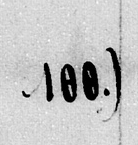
104.)
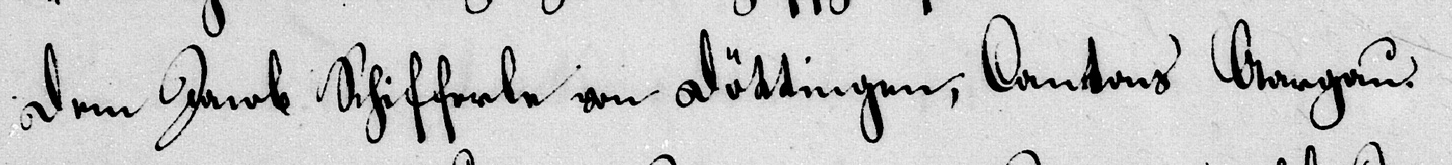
Dem Jacob Schifferle von Döttingen, Cantons Aargau.
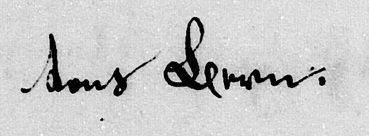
tons Bern.
